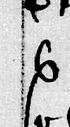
e.
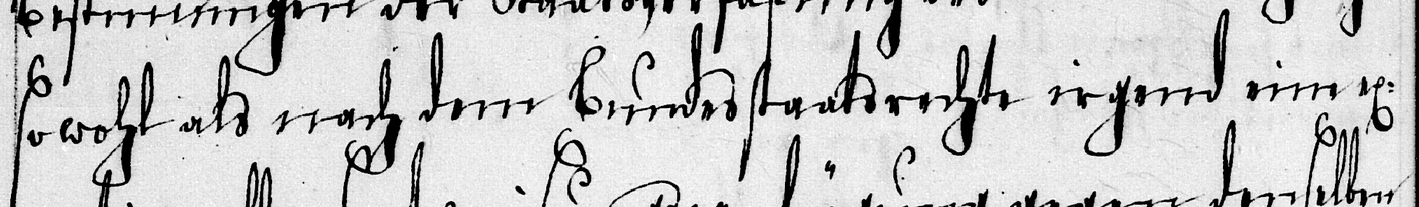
sowohl als nach dem Bundesstaatsrechte irgend eine ex¬
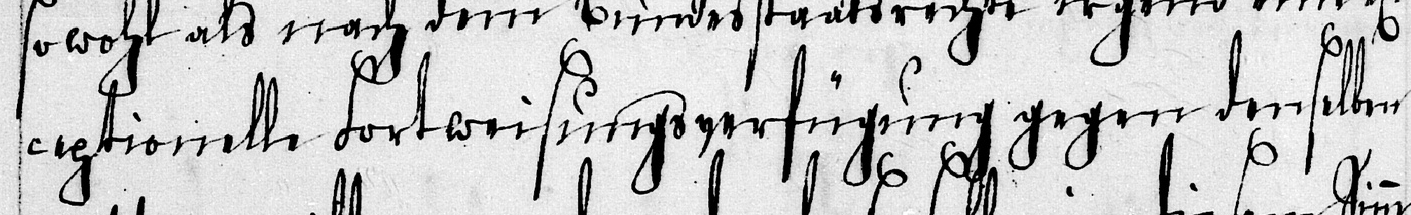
ceptionelle Fortweisungsverfügung gegen denselben
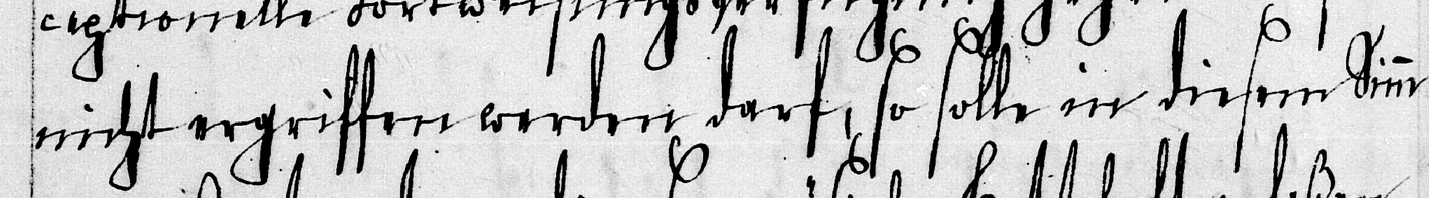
nicht ergriffen werden darf, so solle in diesem Sin¬
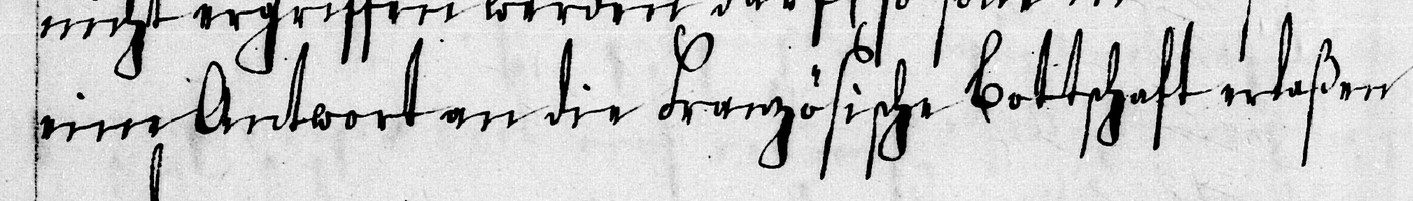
eine Antwort an die Französische Bottschaft erlaßen
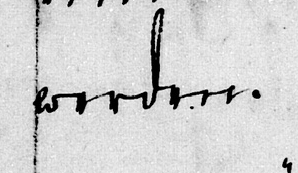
werden.
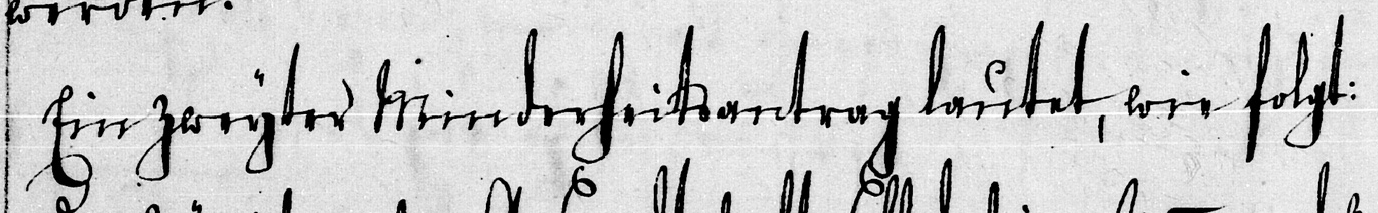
Ein zweyter Minderheitsantrag lautet, wie folgt:
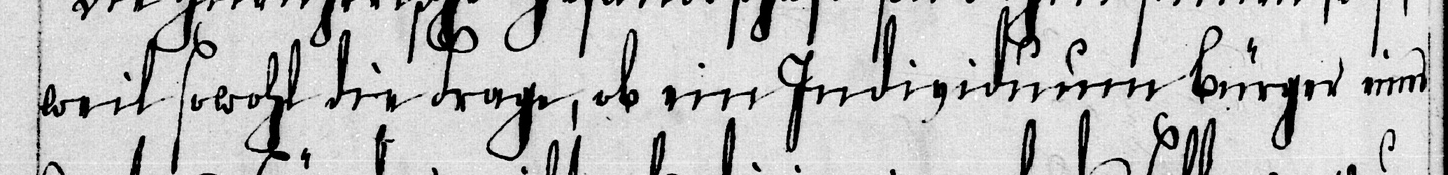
weil sowohl die Frage, ob ein Individuum Bürger eines
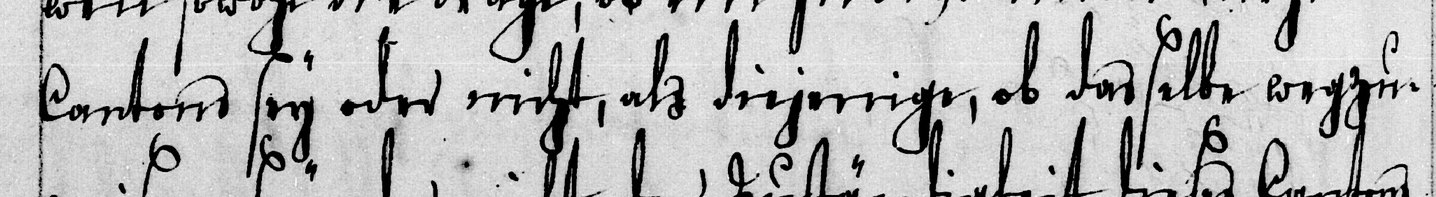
Cantons sey oder nicht, als diejenige, ob dasselbe wegzu¬
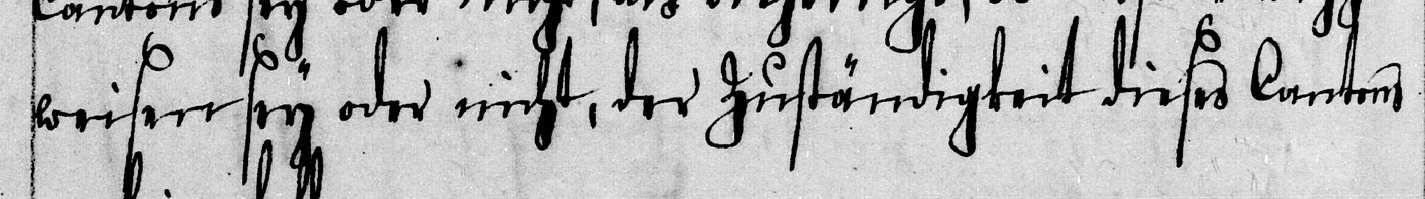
weisen sey oder nicht, der Zuständigkeit dieses Cantons
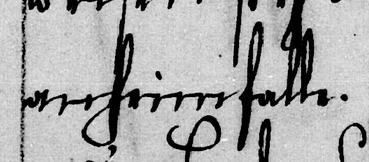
anheimfall¬
